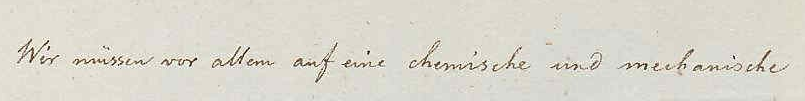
Wir müssen vor allem auf eine chemische und mechanische
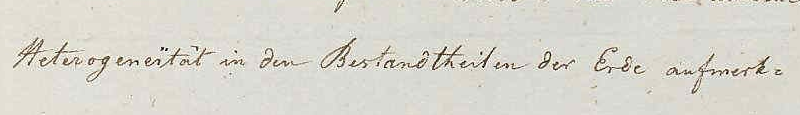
Heterogeneïtät in den Bestandtheilen der Erde aufmerk-
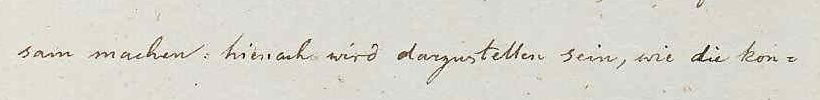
sam machen: hienach wird darzustellen sein, wie die kon-
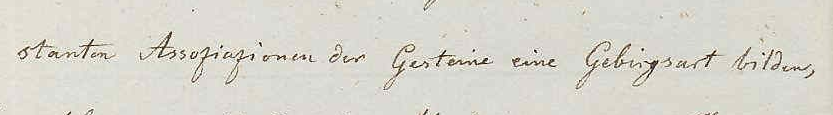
stanten Assoziazionen der Gesteine eine Gebirgsart bilden,
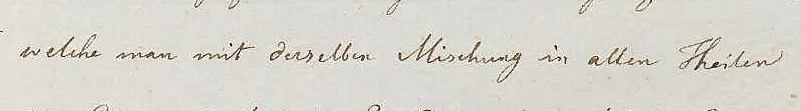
welche man mit derselben Mischung in allen Theilen
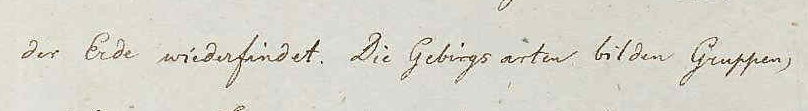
der Erde wiederfindet. Die Gebirgsarten bilden Gruppen,
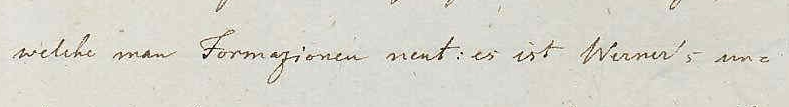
welche man Formazionen nent: es ist Werner's un-
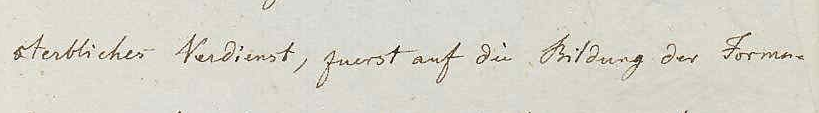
sterbliches Verdienst, zuerst auf die Bildung der Forma-
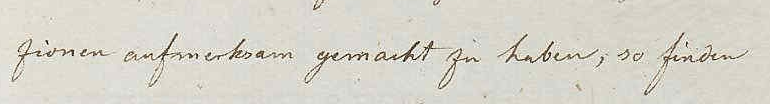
zionen aufmerksam gemacht zu haben, so finden
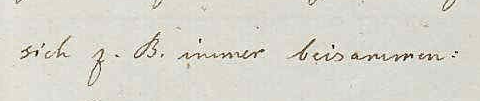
sich z. B. immer beisammen:
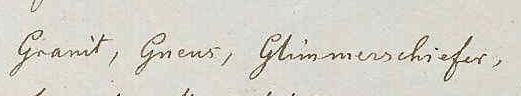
Granit, Gneus, Glimmerschiefer,
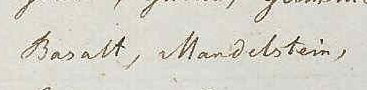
Basalt, Mandelstein,
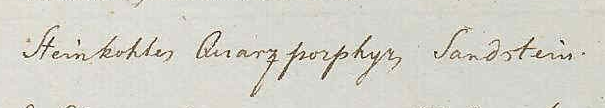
Steinkohle, Quarzporphyr, Sandstein.
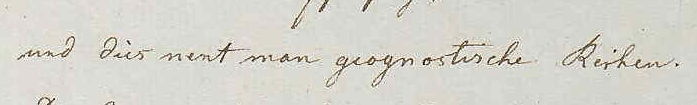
und dies nent man geognostische Reihen.
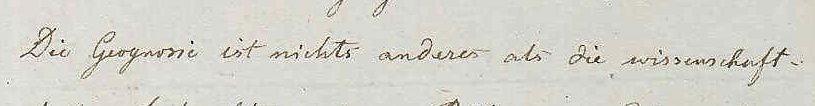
Die Geognosie ist nichts anderes als die wissenschaft-
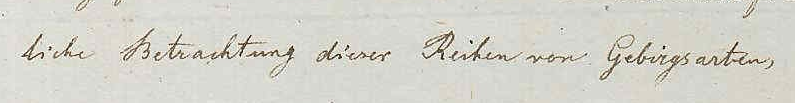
liche Betrachtung dieser Reihen von Gebirgsarten,
